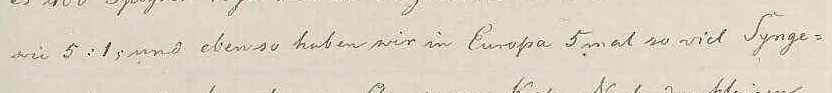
wie 5:1; und ebenso haben wir in Europa 5 mal so viel Synge-
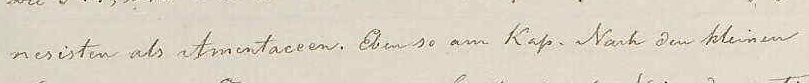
nesisten als Amentaceen. Eben so am Kap. Nach den kleinen
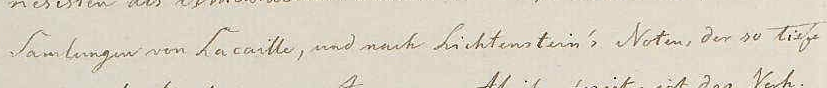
Samlungen von Lacaille, und nach Lichtenstein's Noten, der so tiefe
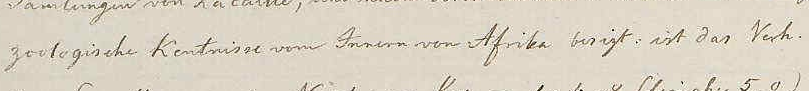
zoologische Kentnisse vom Innern von Afrika besizt: ist das Verh.
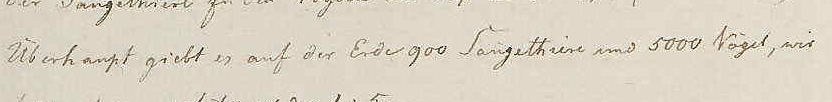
Überhaupt giebt es auf der Erde 900 Säugethiere und 5000 Vögel, wir
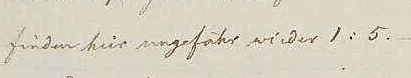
finden hier ungefähr wieder 1:5. –
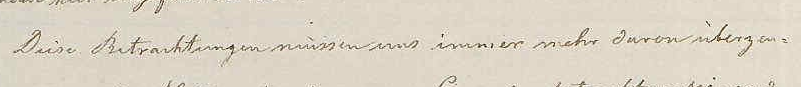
Diese Betrachtungen müssen uns immer mehr davon überzeu-
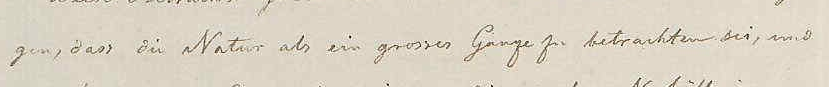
gen, dass die Natur als ein grosses Ganze zu betrachten sei, und
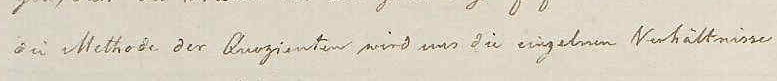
die Methode der Quozienten wird uns die einzelnen Verhältnisse
